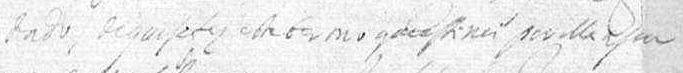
dado, de que se fez este termo que assinei por ella a seu
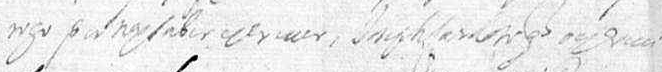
rogo por naꝭ saber escreuer, Ioseph Cardoso q̄ o escreui
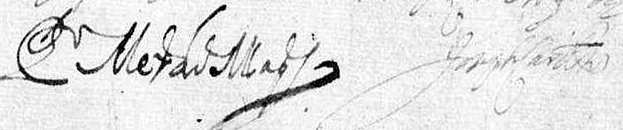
P.o Mexa de Mages Joseph Cardoso
